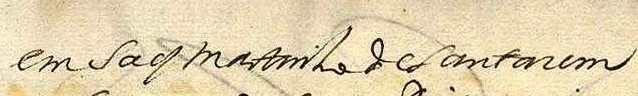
em saõ martinho de santarem
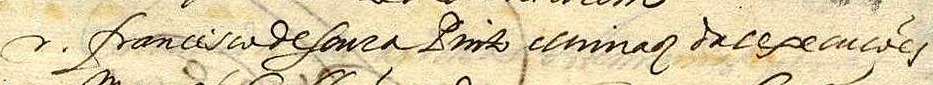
item. francisco de souza Pinto escriuaõ das execuçoẽs
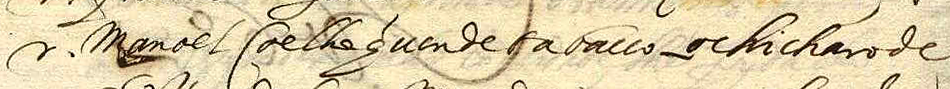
item. Manoel Coelho q̄ uende tabacco o chicharo de
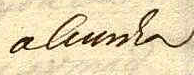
alcunha
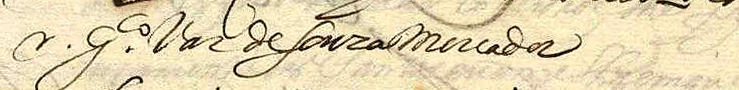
item. G.ço Vaz de souza mercador
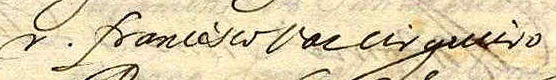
item. francisco vaz cirgueiro
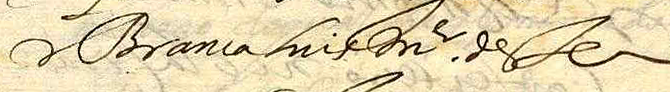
item Branca luis mer deste
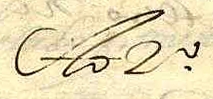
Ao 2o.
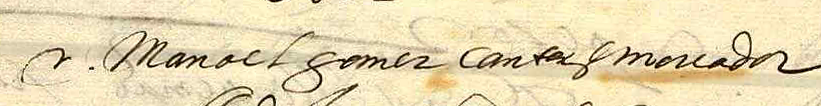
item. Manoel gomez cantor E mercador
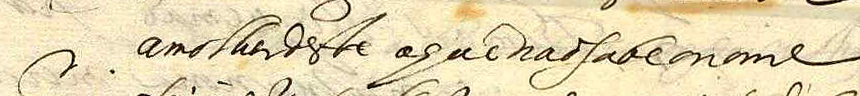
item. a molher deste a quē naõ sabe o nome
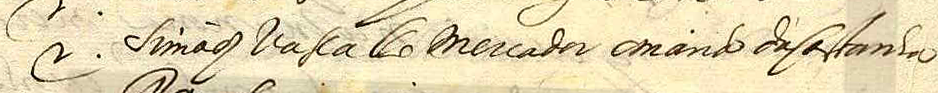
item. Simaõ Vassallo mercador e marido da Castanha
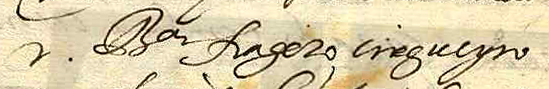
item. Bar fragozo cirgueyro
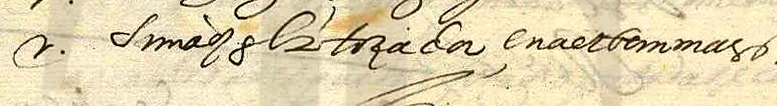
item. Simaõ glz̄ tozador e naõ tem mais
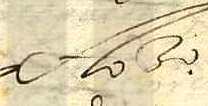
Ao 3o.
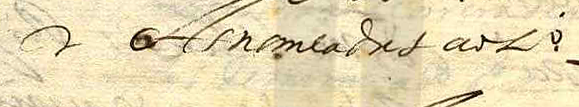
item As nomeadas ao 1o.
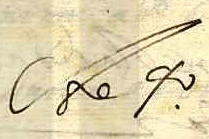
Ao 4.o
